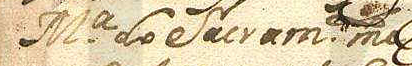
M.a do Sacram.to me
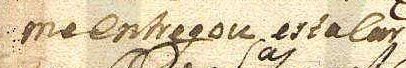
me entregou esta Car
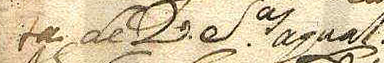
ta de V. S.as a qual
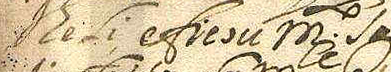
lhe li, e ficou m.to sa
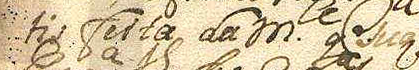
tisfeita da m.ce q̄ sua
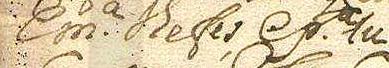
Em.a lhe fes, e p.a tu
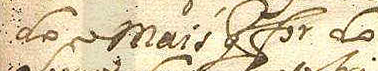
do o mais q̄ for do
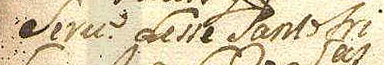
Seru.o desse santo tri
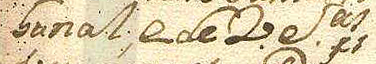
bunal, e de V. S.as
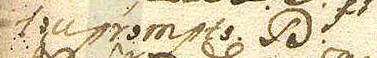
sou prompto. D.s
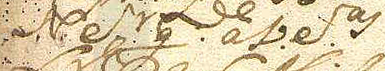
N. S.r g.de a V. S.as
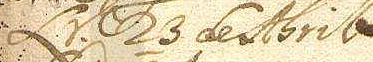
Lr.a 23 de Abril
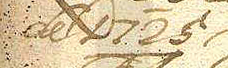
de 1725
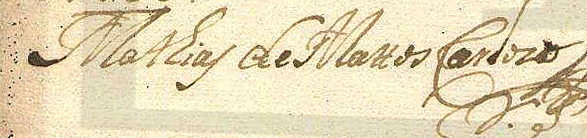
Mathias de Mattos Cardozo
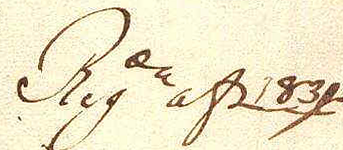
Regda a fl 183
